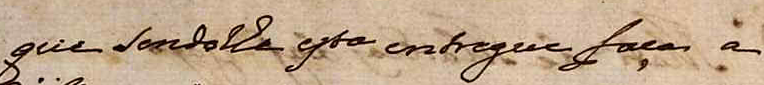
que sendolhe esta entregue faça a
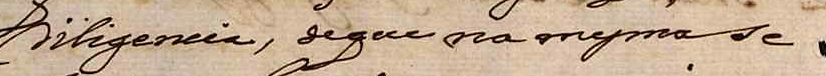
diligencia, de que na mesma se
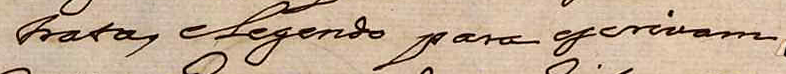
trata, elegendo para escrivam
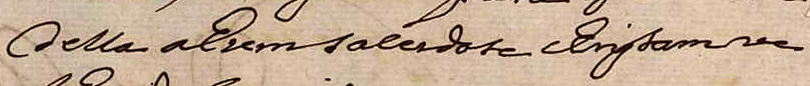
della a hum sacerdote christam ve
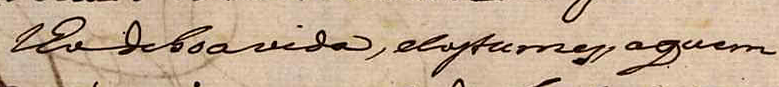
lho de boa vida, e costumes, a quem
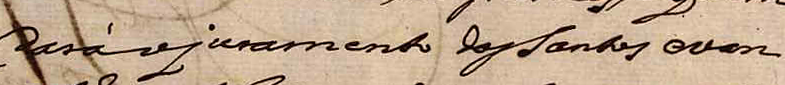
dará o juramento dos Santos evan
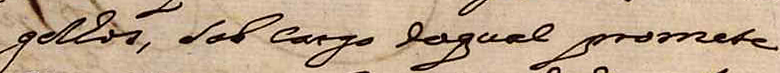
gelhos, sob cargo do qual promete
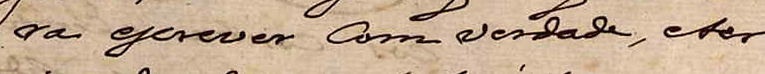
ra escrever com verdade, e ter
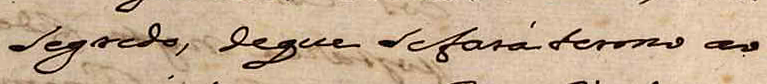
segredo, de que se fará termo ao
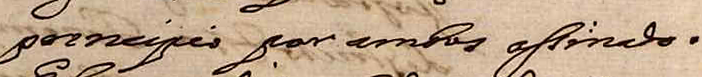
principio por ambos assinado.
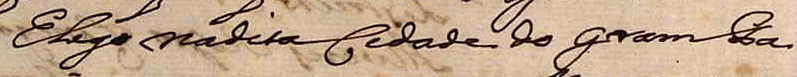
E logo na dita Cidade do Gram Pa
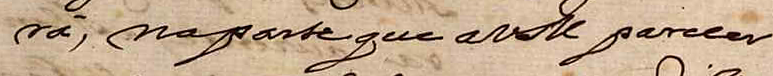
rá, na parte que a VM parecer
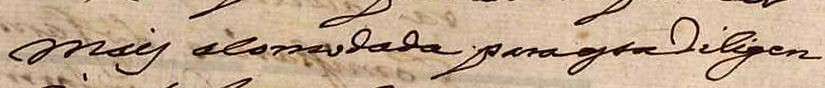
mais acomodada para esta diligen
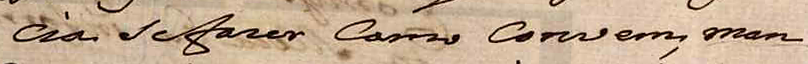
cia se fazer Como convem, man
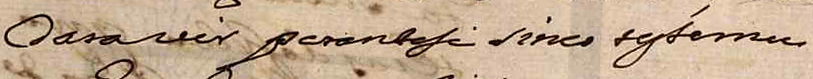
dara vir perante si sinco testemu
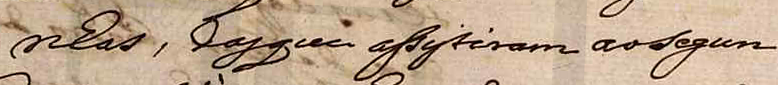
nhas, das que assistiram ao segun
